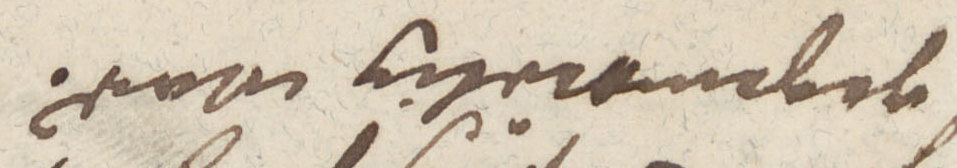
diese R Spuren aber Aber alle diese
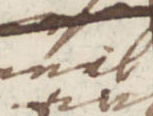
dieselben
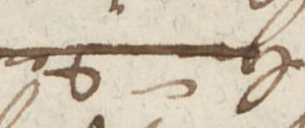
diess %
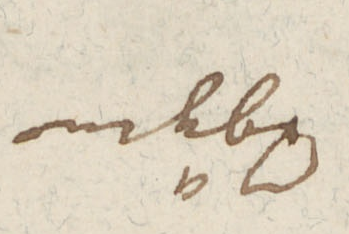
primitiven
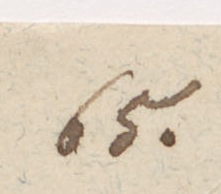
65.
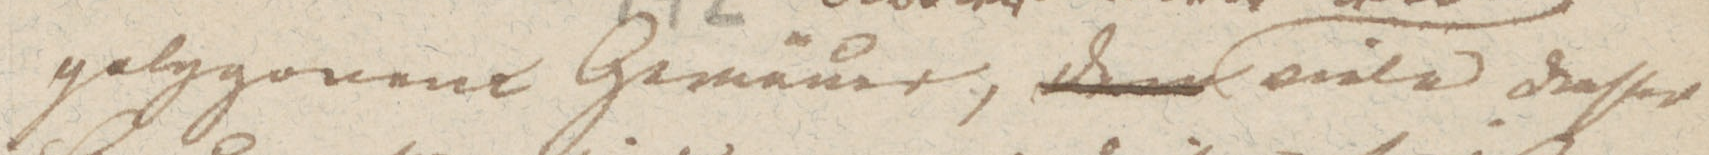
polygonene Gemäuer, dem diess wissen wir weil viele dieser
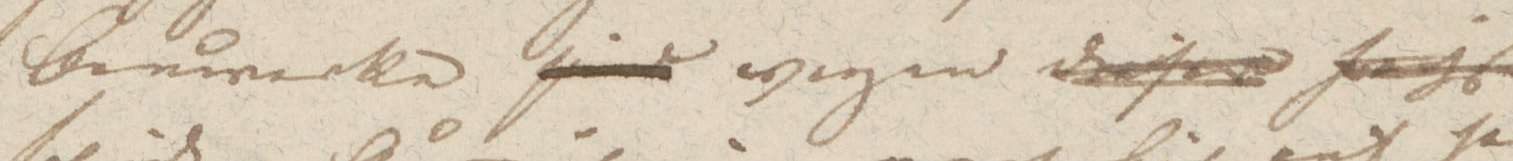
Bauwerke sind wegen dieser höchst
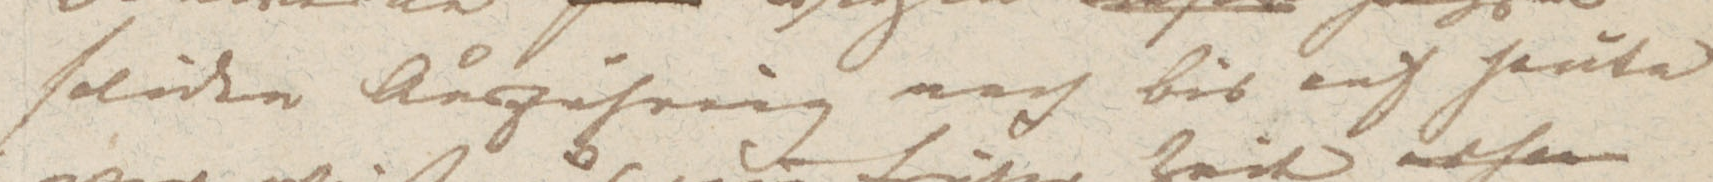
soliden Ausführung nach bis auf heute
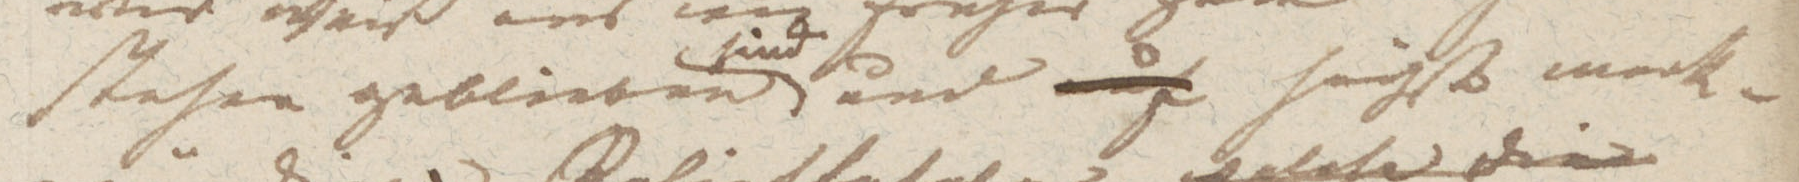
stehen geblieben sind und auf höchst merk-
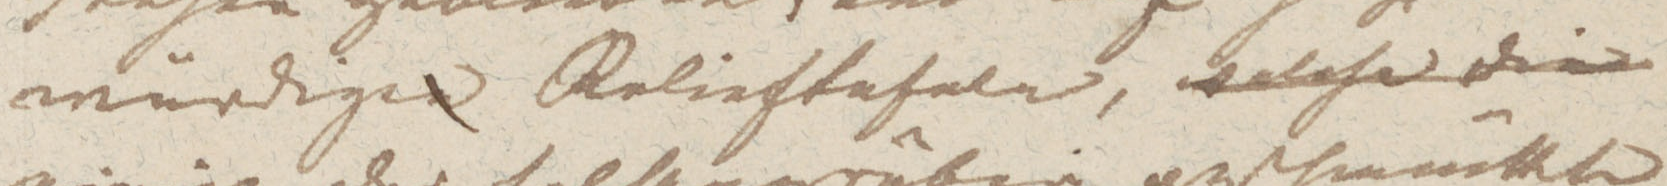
würdigen Relieftafeln, welche die
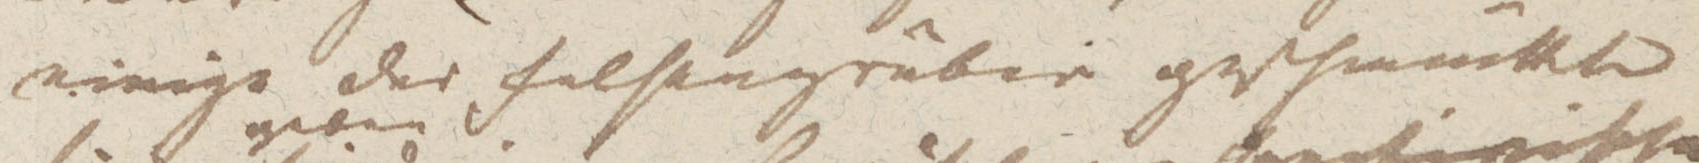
einige der Felsengräber geschmückt
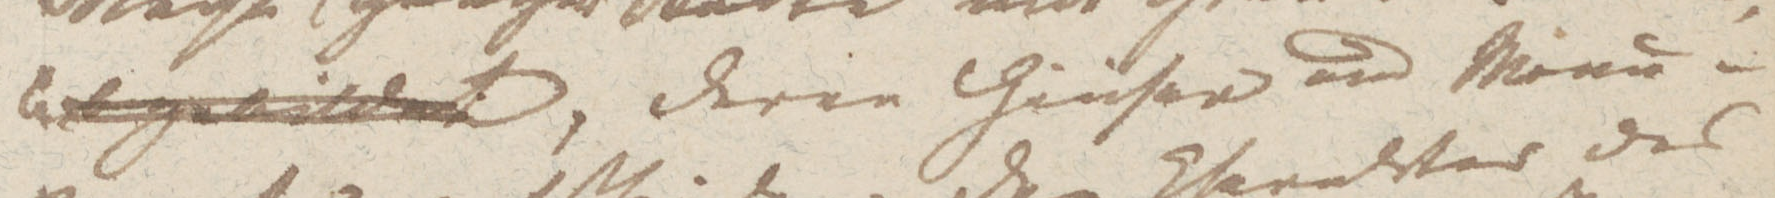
abgebildet, deren Häuser und Monu-
